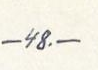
48
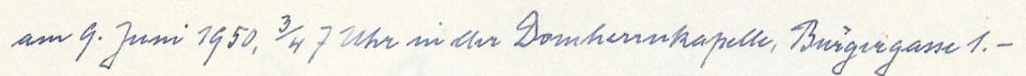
am 9. Juni 1950, ¾ 7 Uhr in der Domherrenkapelle, Bürgergasse, 1.-
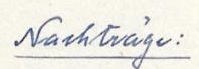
Nachträge:
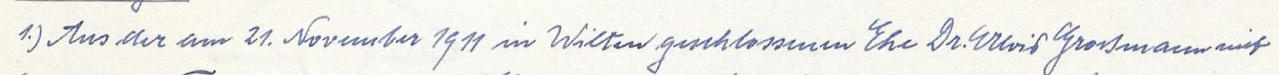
1) Aus der am 21. November 1911 in Wilten geschlossenen Ehe Dr. Alois Großmann mit
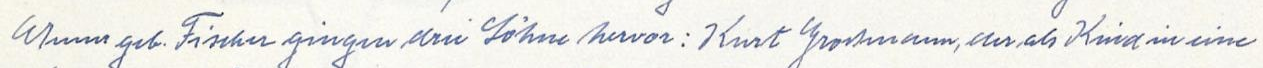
Anna geb. Fischer gingen drei Söhne hervor: Kurt Großmann, der als Kind in eine
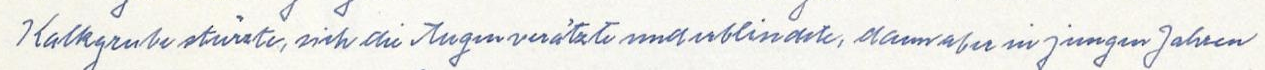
Kalkgrube stürzte, sich die Augen verätzte und erblindete, dann aber in jungen Jahren
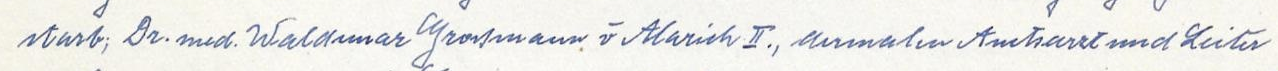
starb; Dr. med. Waldemar Großmann v/o Alarich II, dermalen Amtsarzt und Leiter
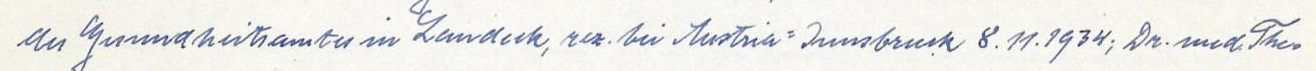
des Gesundheitsamtes in Landeck, rez. bei Austria Innsbruck 8.11.1934; Dr. med. The-
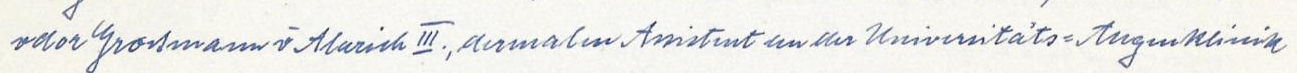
odor Großmann v/o Alarich III, dermalen Assistent an der Universitäts- Augenklinik
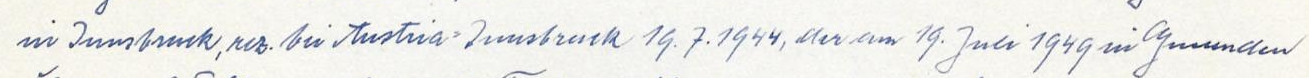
in Innsbruck, rez. bei Austria Innsbruck 19.7.1944, der am 19. Juni 1949 in Gmunden
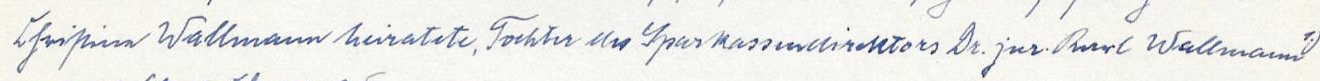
Christine Wallmann heiratete, Tochter des Sparkassendirektors Dr. jur. Karl Wallmann
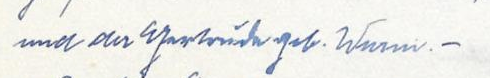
und der Gertrude geb. Wurm.-
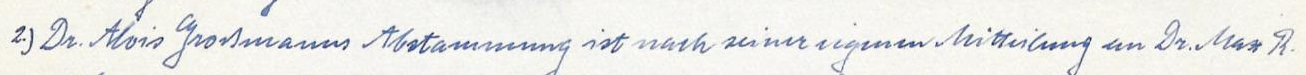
2) Dr. Alois Großmanns Abstammung ist nach seiner eigenen Mitteilung an Dr. Max R
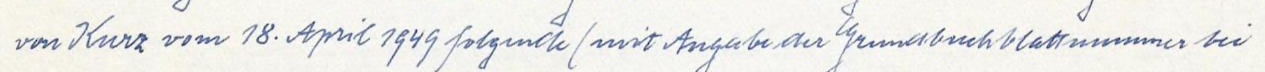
von Kurz vom 8. April 1949 folgende (mit Angabe der Grundbuchblattnummer bei
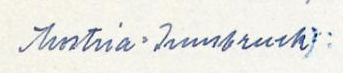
Austria Innsbruck):
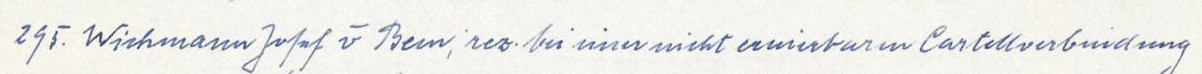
295. Wichmann Josef v/0 Bein, rez. bei einer nicht eruierbaren Cartellverbindung
